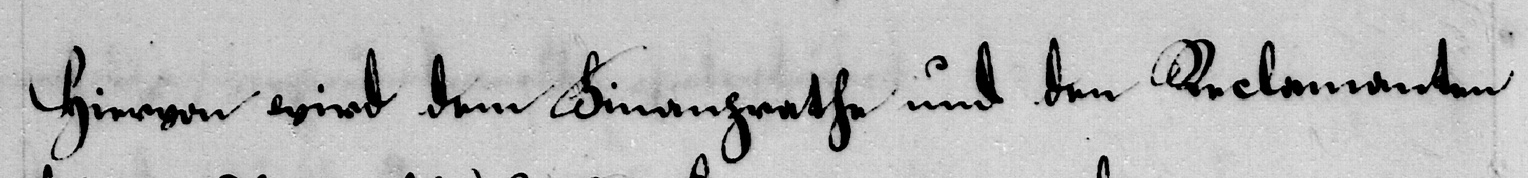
Hiervon wird dem Finanzrathe und dem Reclamanten
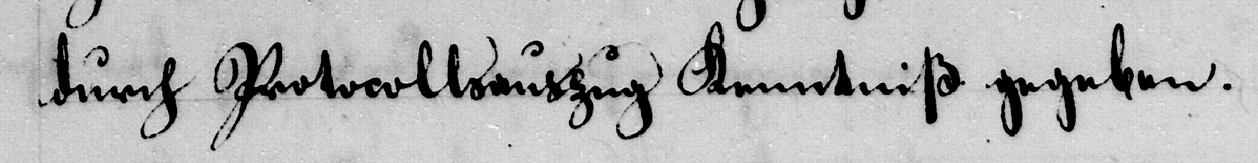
durch Protocollsauszug Kenntniß gegeben.
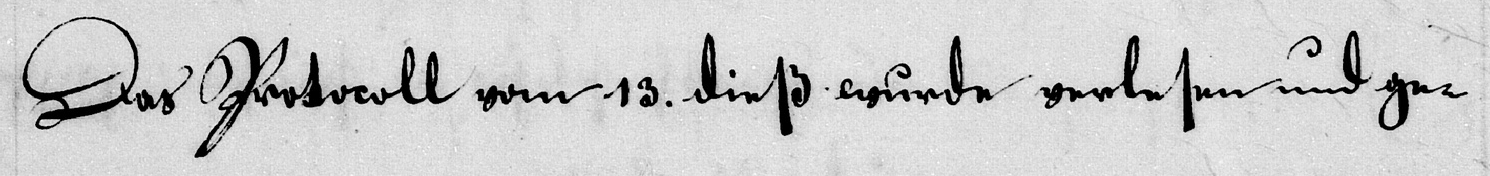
Das Protocoll vom 13. [sic!] dieß wurde verlesen und ge¬
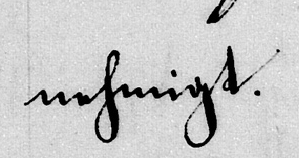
nehmigt.
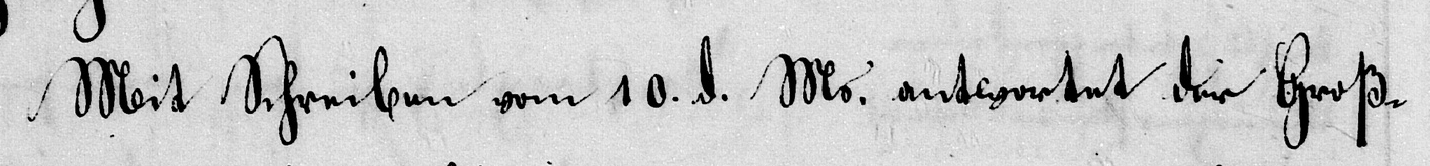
Mit Schreiben vom 10. d. Ms. antwortet der Groß¬
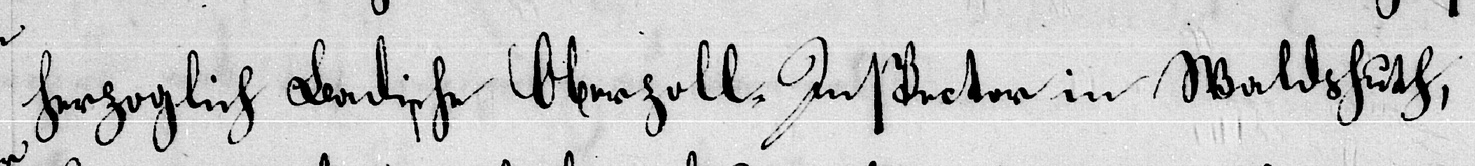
herzoglich Badische Oberzoll-Inspector in Waldshuth,
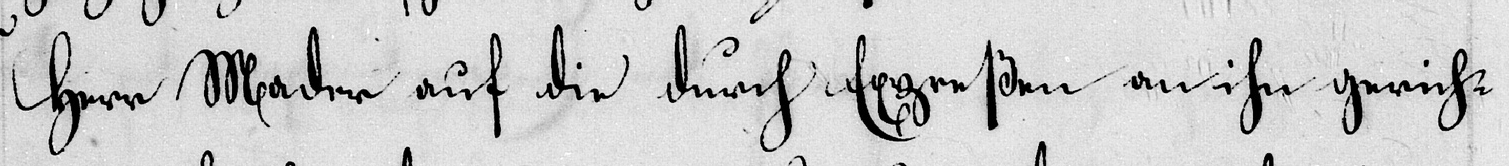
Herr Mader auf die durch Experten an ihn gerich¬
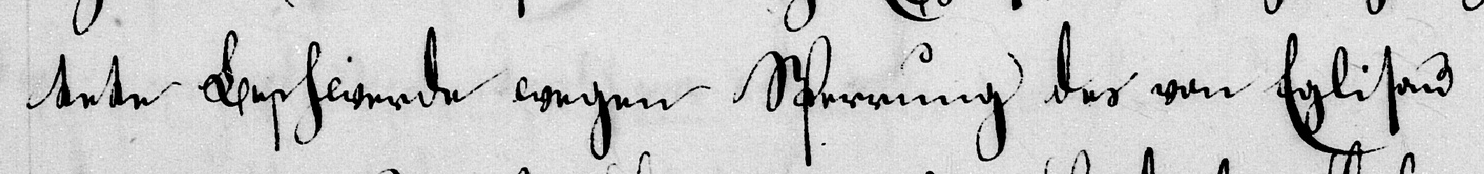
tete Beschwerde wegen Sperrung des von Eglisau
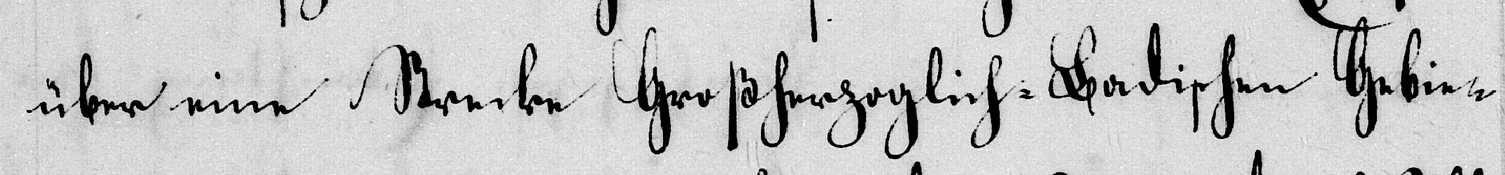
über eine Strecke Großherzoglich-Badischen Gebie¬
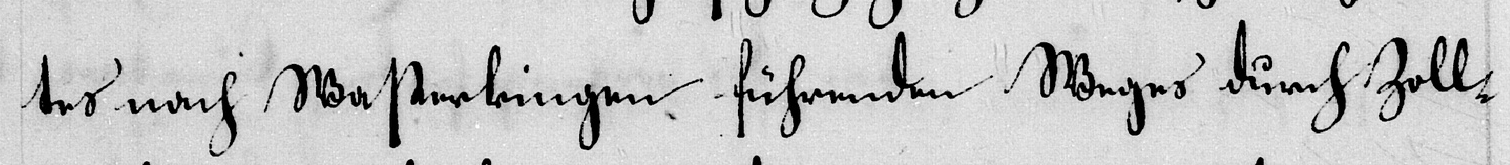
tes nach Wasterkingen führenden Weges durch Zoll¬
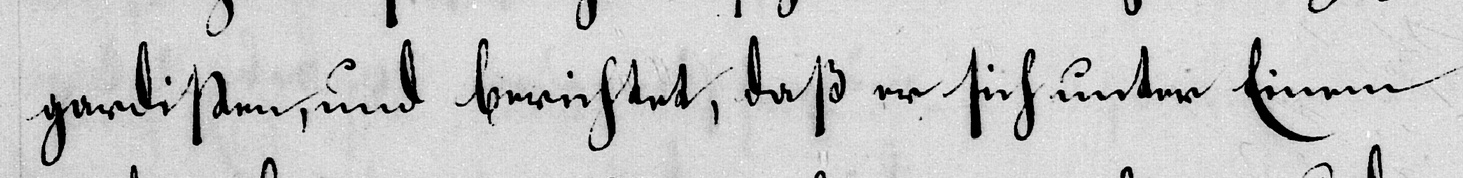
gardisten, und berichtet, daß er sich unter Einem
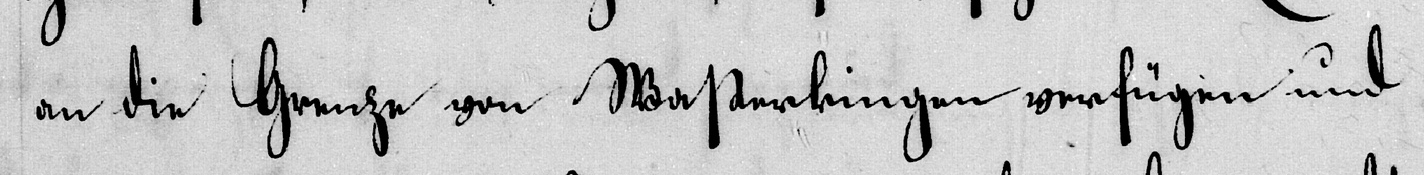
an die Grenze von Wasterkingen verfügen und
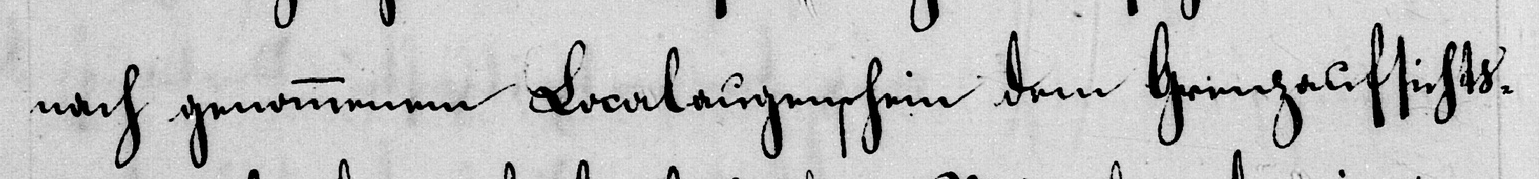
nach genommenen Localaugenschein dem Grenzaufsichts¬
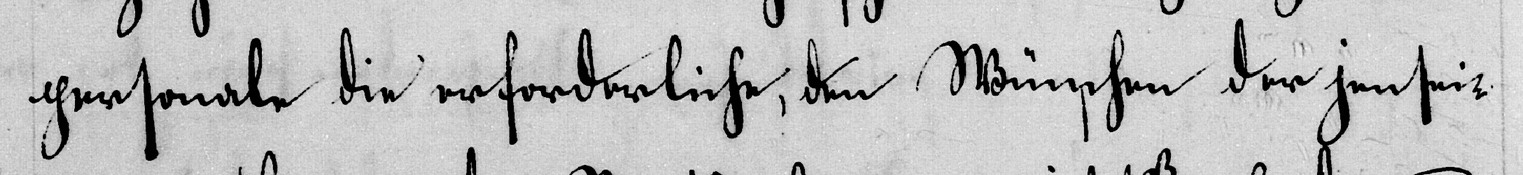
personale die erforderliche, den Wünschen der jensei¬
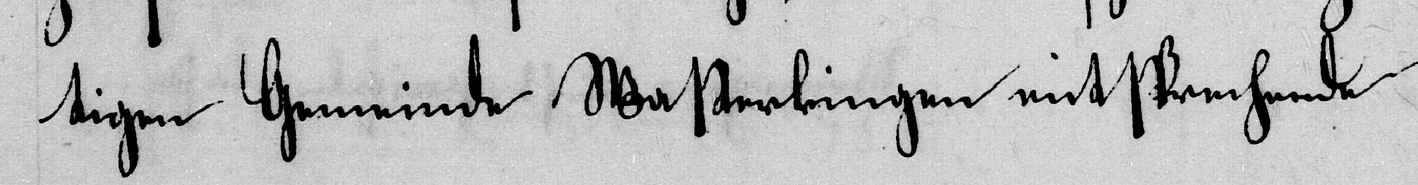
tigen Gemeinde Wasterkingen entsprechende
